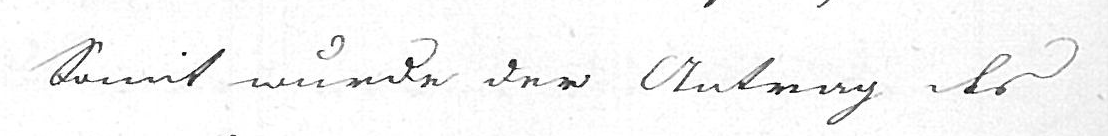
Somit wurde der Antrag des
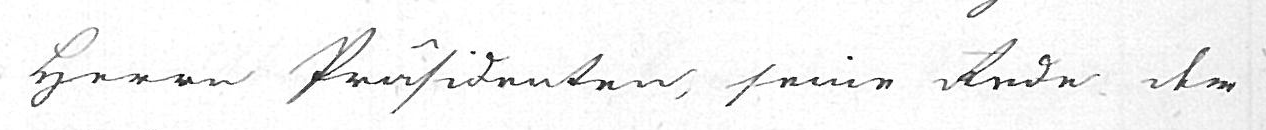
Herrn Präsidenten, seine Rede der
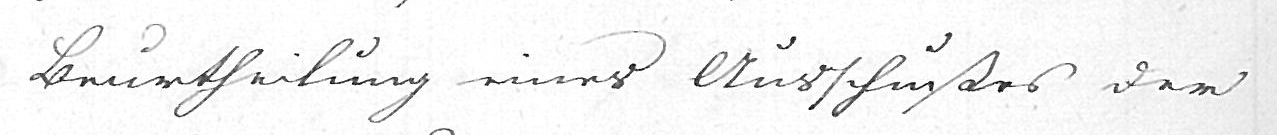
Beurtheilung eines Ausschusses der
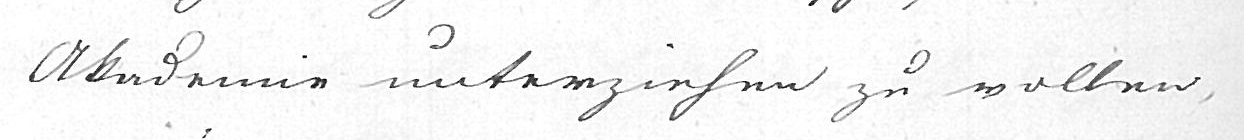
Akademie unterziehen zu wollen,
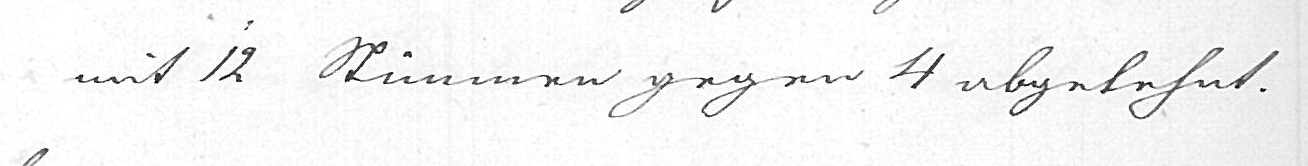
mit 12 Stimmen gegen 4 abgelehnt.
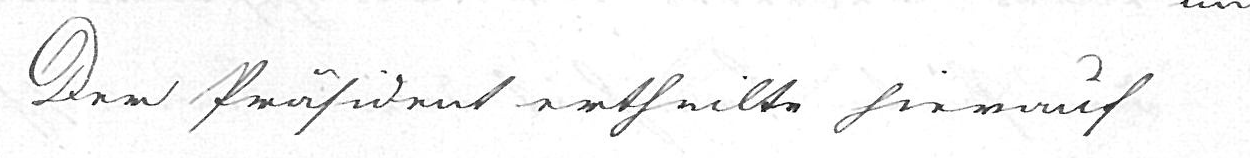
Der Präsident ertheilte hierauf
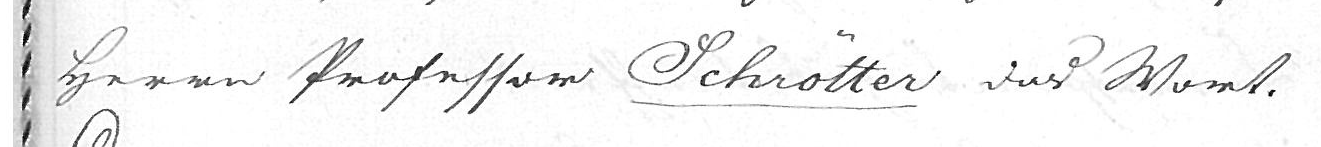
Herrn Professor Schrötter das Wort.
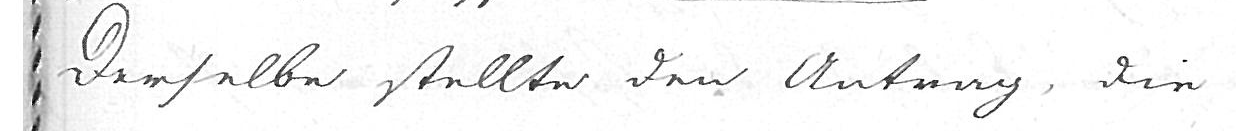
Derselbe stellte den Antrag, die
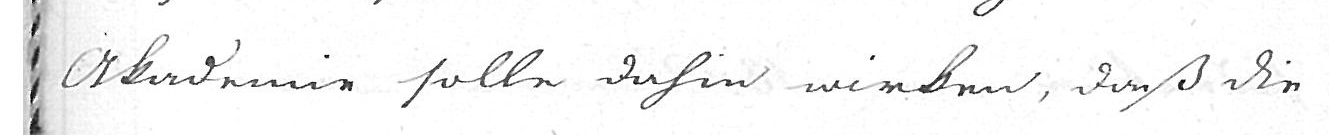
Akademie solle dahin wirken, daß die
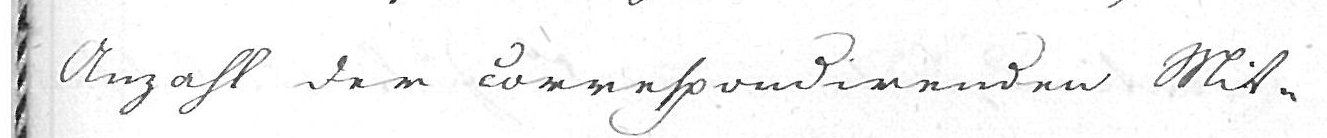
Anzahl der correspondirenden Mit-
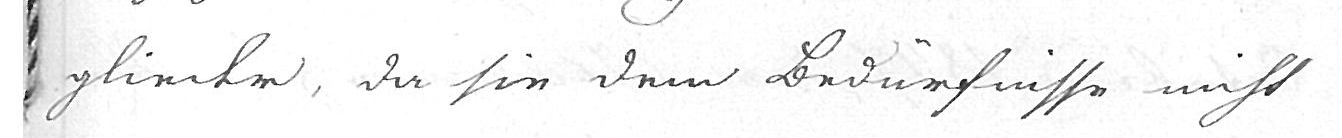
glieder, da sie dem Bedürfnisse nicht
